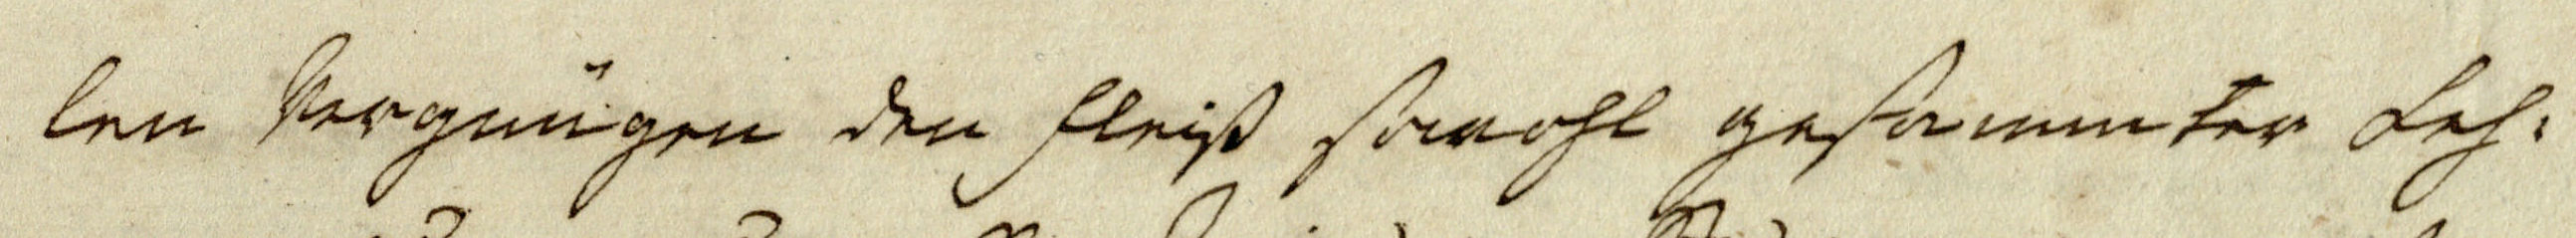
len Vergnügen den Fleiß sowohl gesammter Leh¬
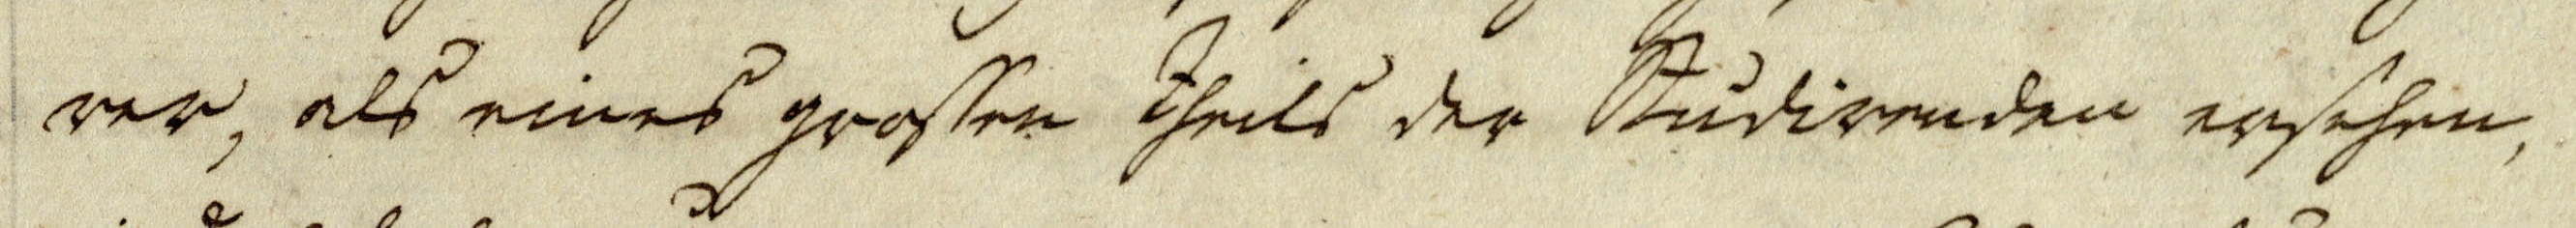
rer, als eines grossen Theils der Studirenden ersehen,
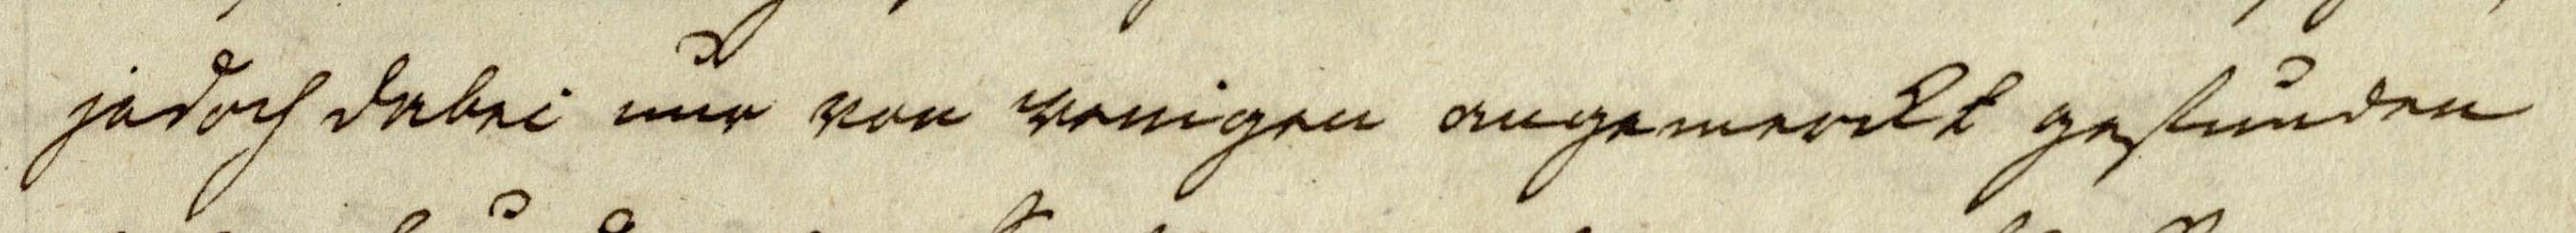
jedoch dabei nur von einigen angemerckt gefunden
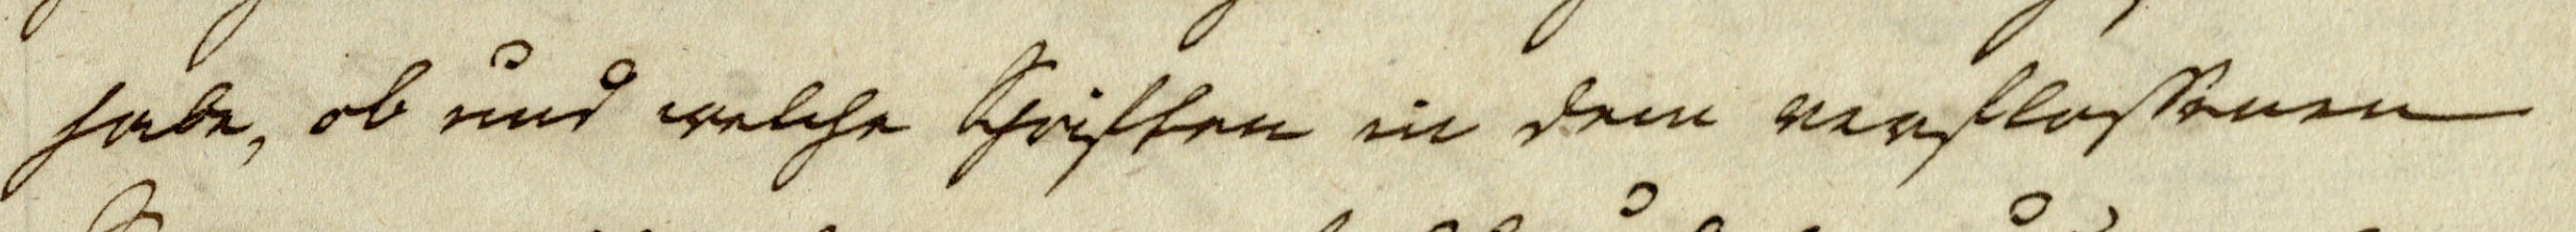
habe, ob und welche Schriften in dem verflossenen
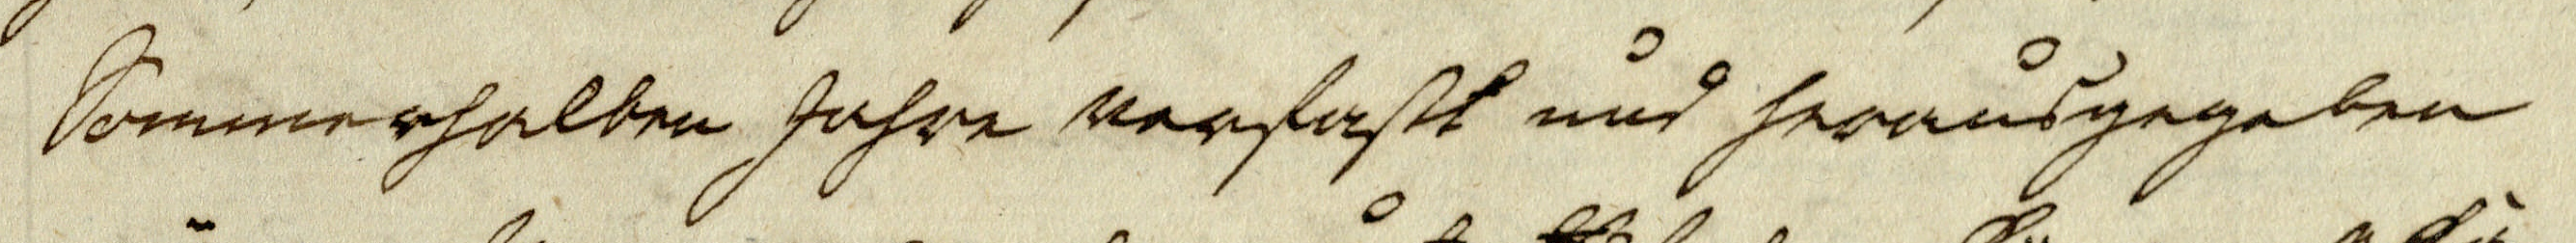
Sommerhalben Jahre verfaßt und herausgegeben
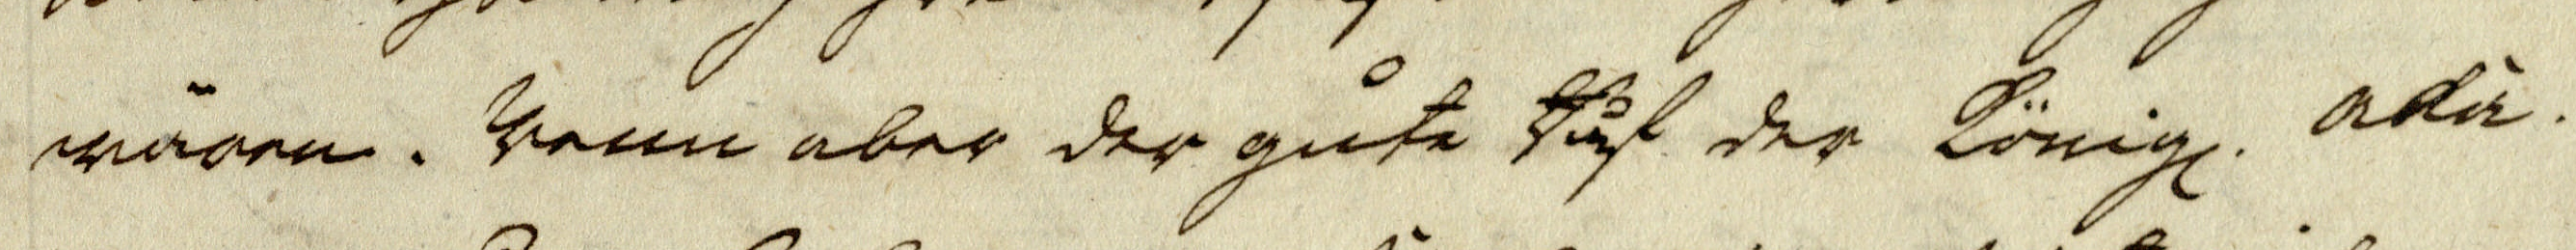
wären. Wenn aber der gute Ruf der Königl. Aka¬
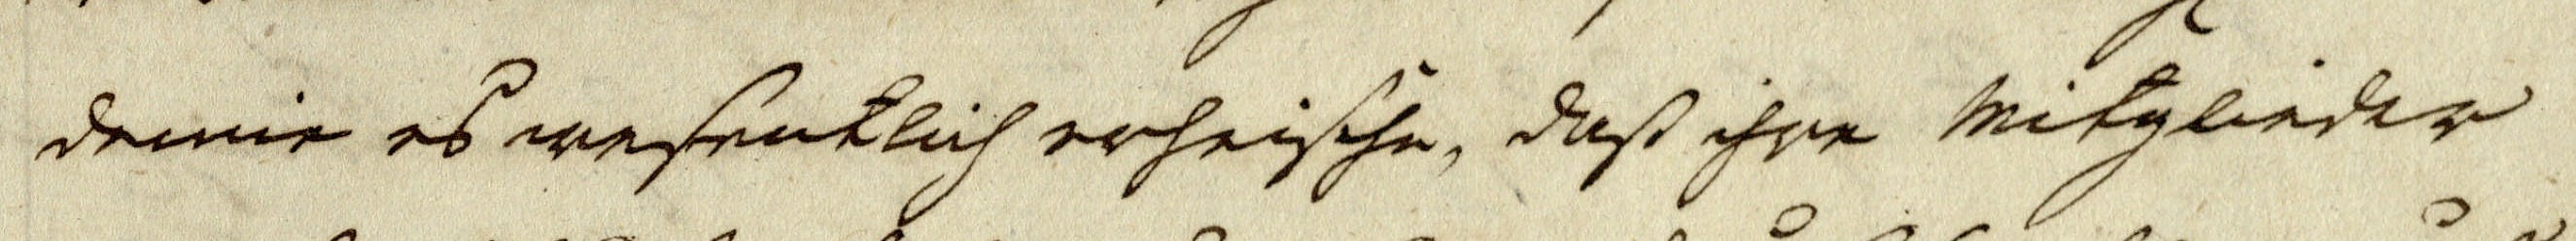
demie es wesentlich erheische, daß ihre Mitglieder
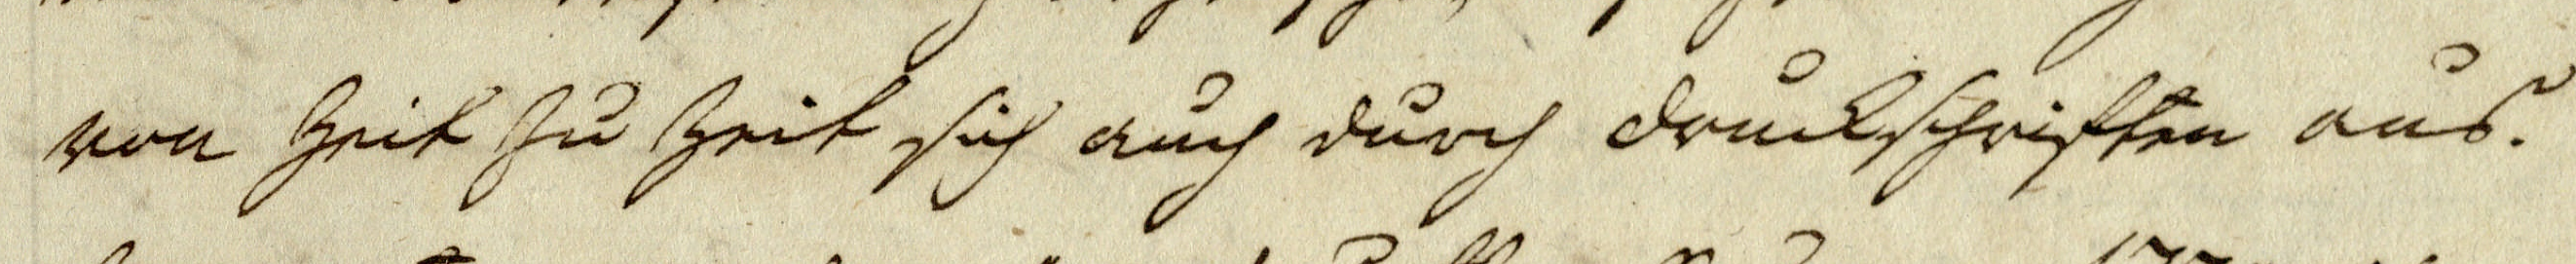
von Zeit zu Zeit sich auch durch Druckschriften aus¬
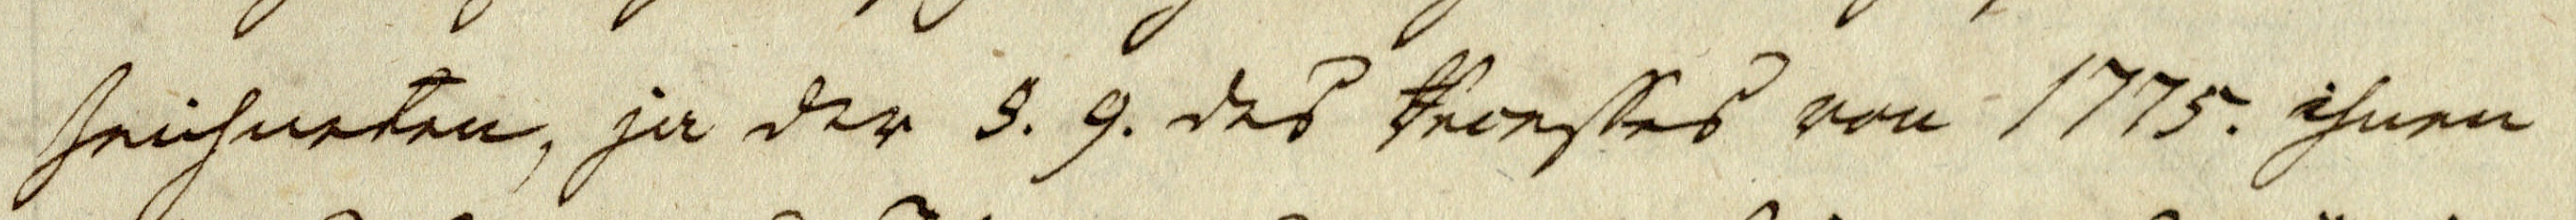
zeichneten, ja der §. 9. des Recesses von 1775. ihnen
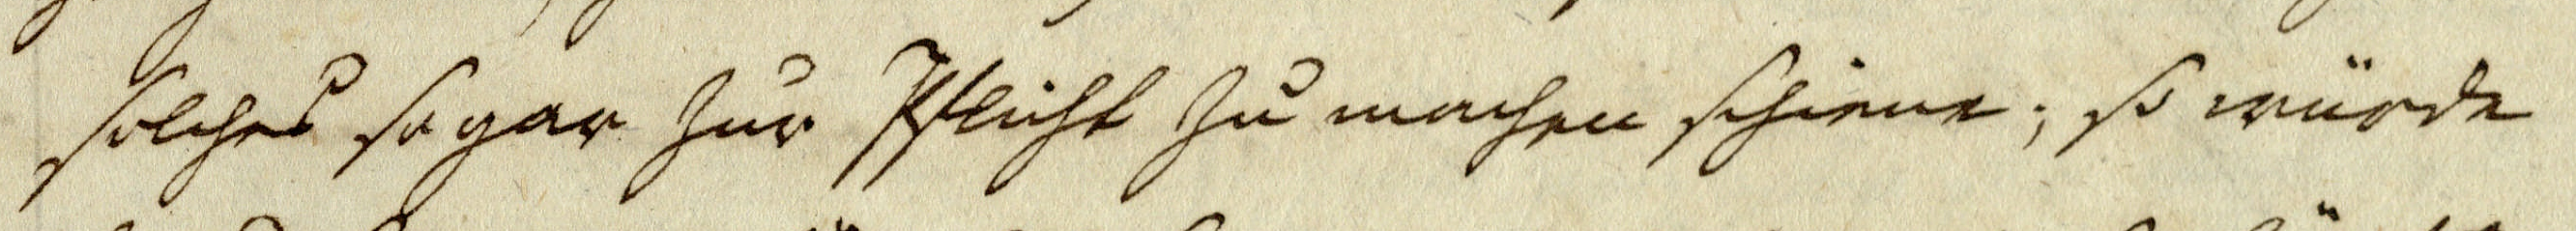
solches so gar zur Pflicht zu machen schiene, so würde
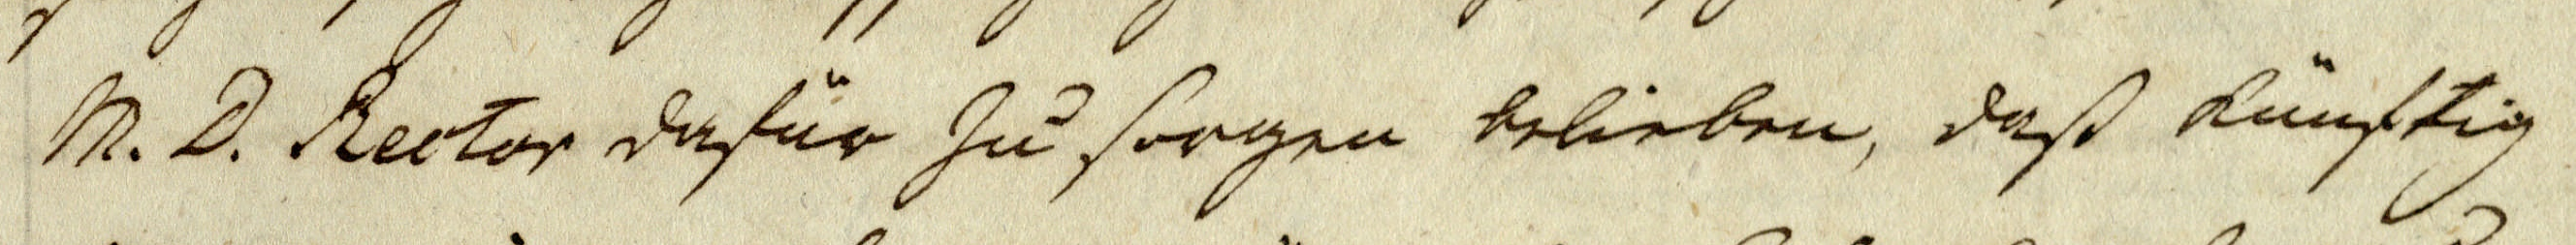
M. D. Rector dafür zu sorgen belieben, daß künftig
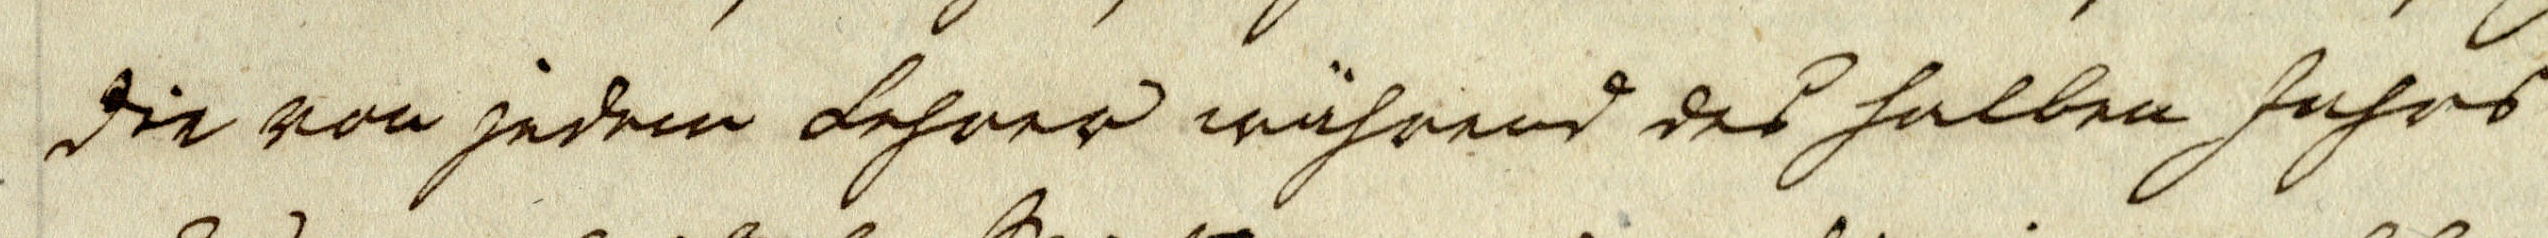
die von jedem Lehrer während des halben Jahres
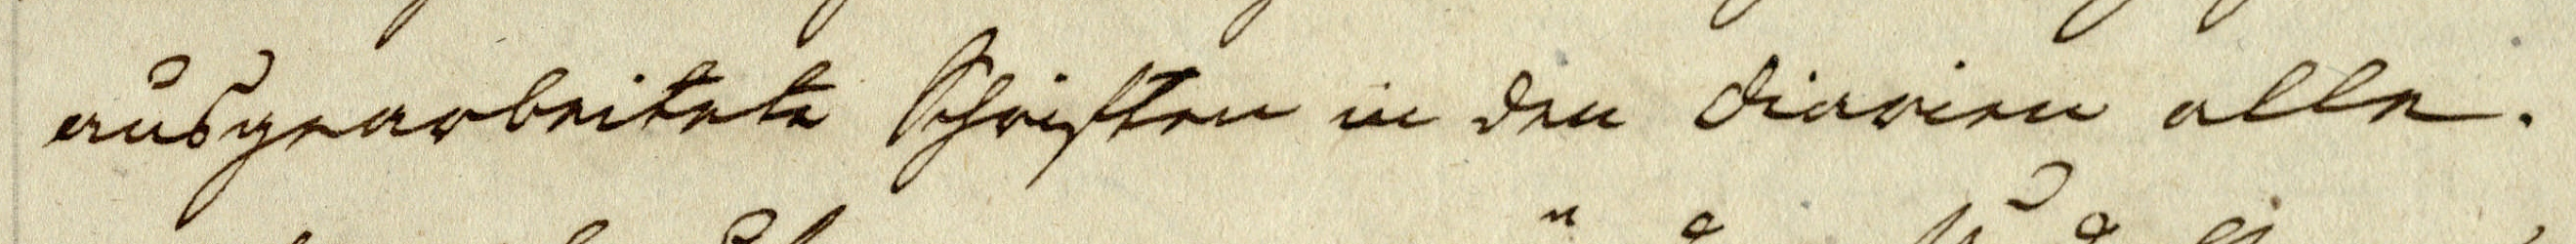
ausgearbeitete Schriften in den Diarien alle¬
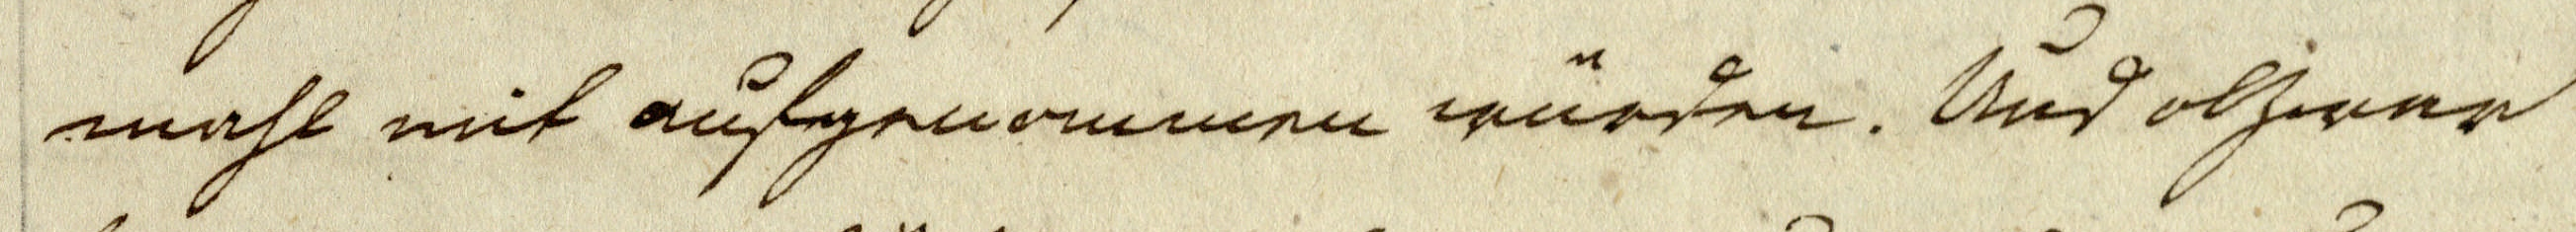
mahl mit aufgenommen würden. Und obzwar
